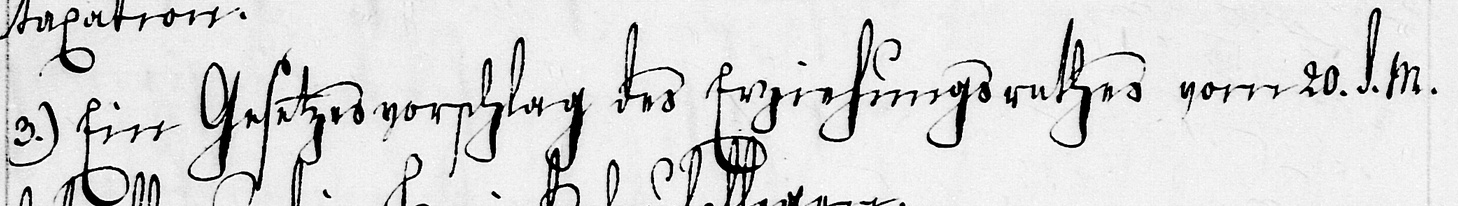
3.) Ein Gesetzesvorschlag des Erziehungsrathes vom 20. d. M.
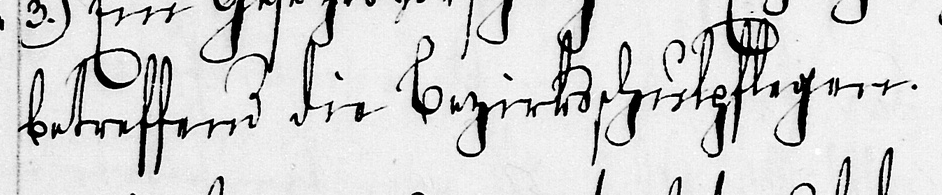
betreffend die Bezirksschulpflegen.
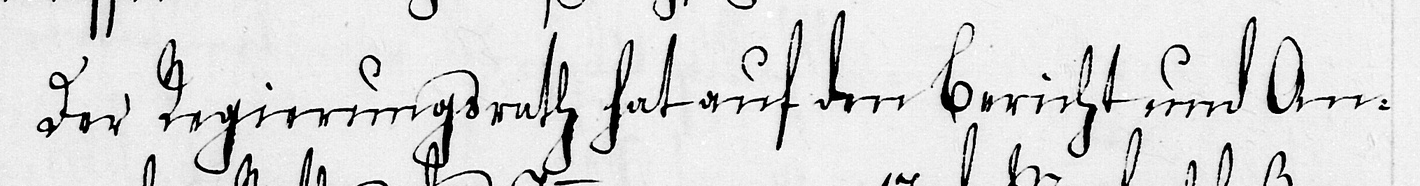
Der Regierungsrath hat auf den Bericht und An¬
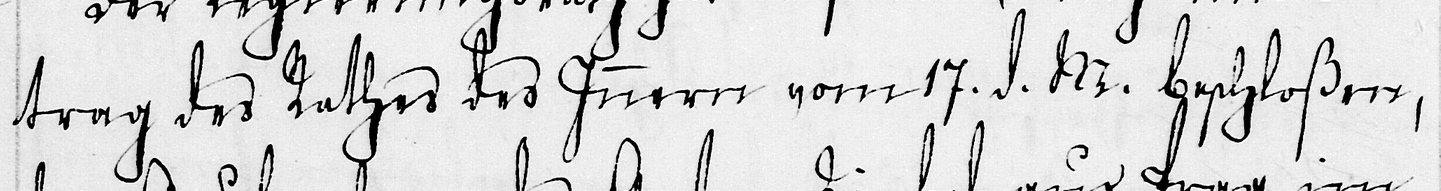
trag des Rathes des Innern vom 17. d. M. beschloßen,
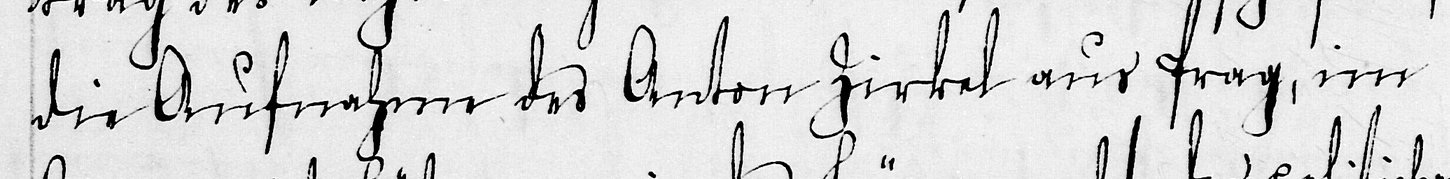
die Aufnahme des Anton Zirkel aus Prag, im
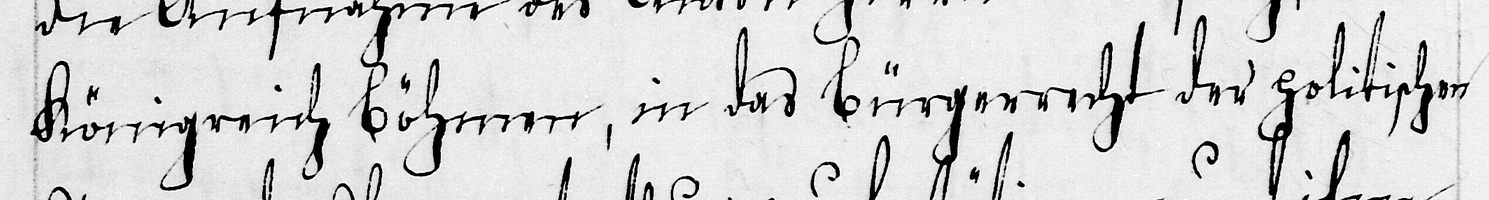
Königreich Böhmen, in das Bürgerrecht der politischen
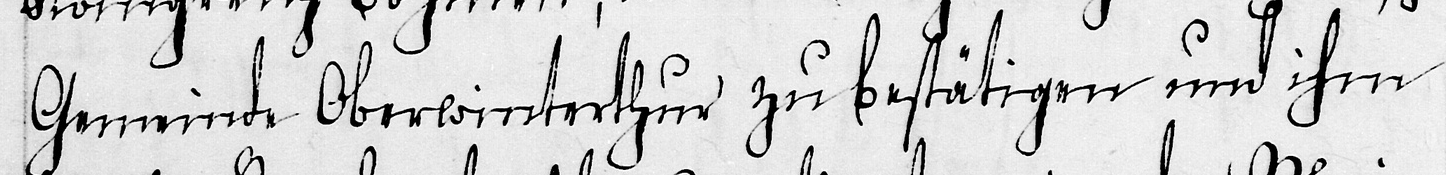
Gemeinde Oberwinterthur zu bestätigen und ihm
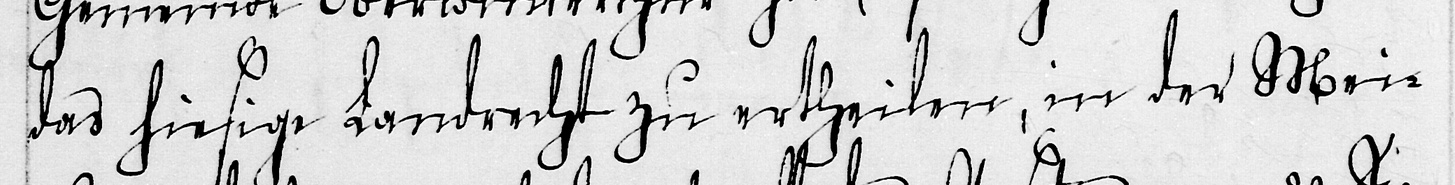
das hiesige Landrecht zu ertheilen, in der Mei¬
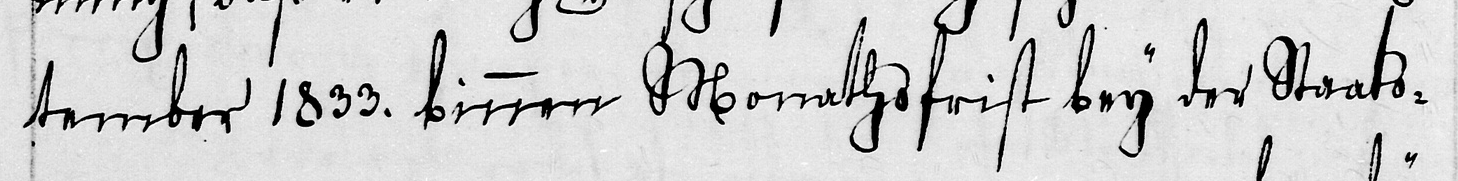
tember 1833. binnen Monathsfrist bey der Staats-
